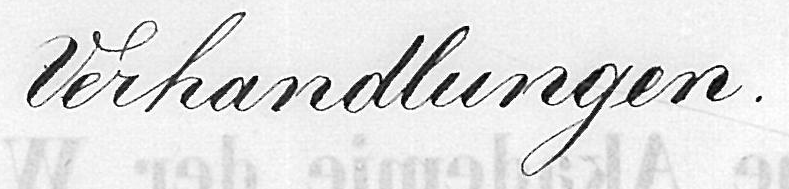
Verhandlungen.
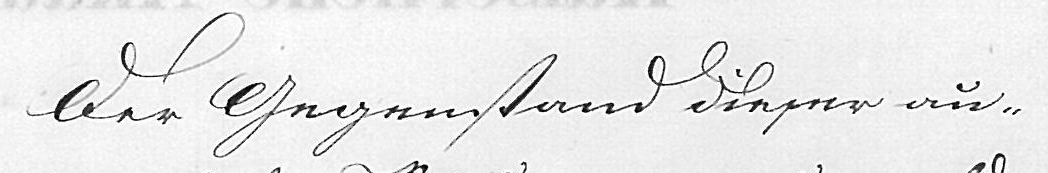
Der Gegenstand dieser au-
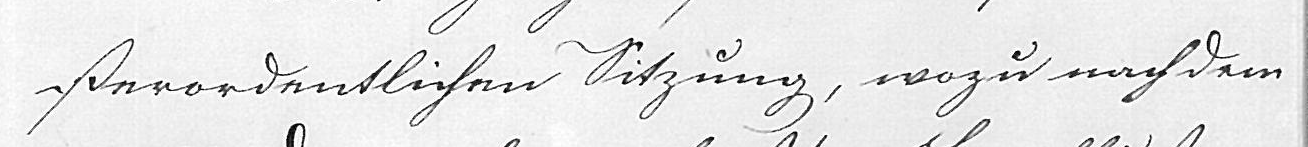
ßerordentlichen Sitzung, wozu nachdem
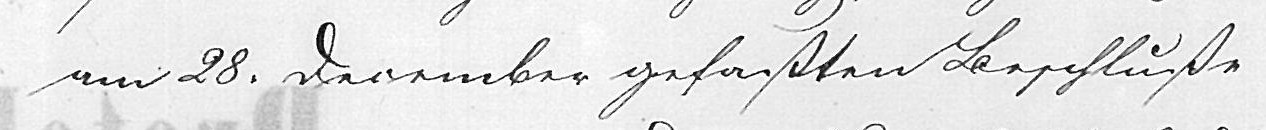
am 28. December gefaßten Beschluße
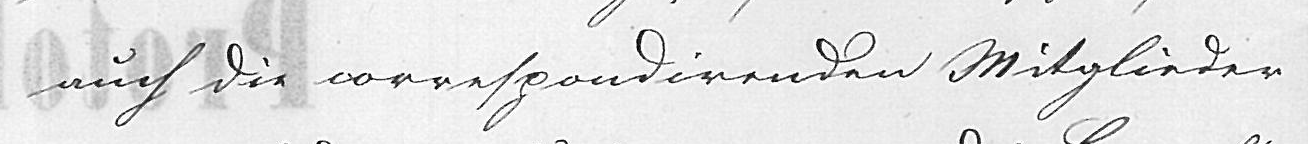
auch die correspondirenden Mitglieder
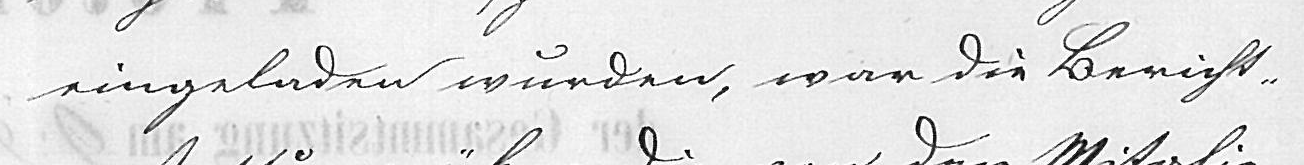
eingeladen wurden, war die Bericht-
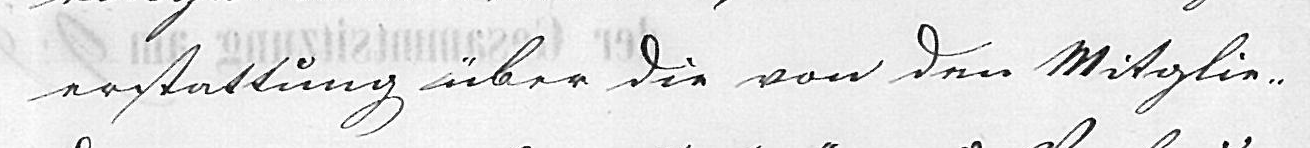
erstattung über die von den Mitglied-
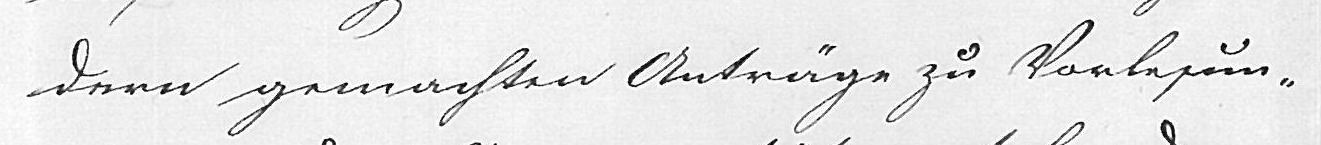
dern gemachten Anträge zu Vorlesun-
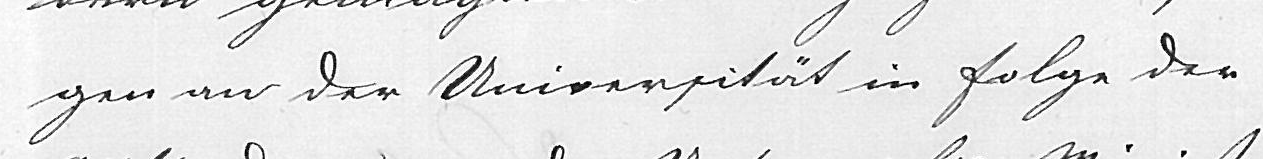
gen an der Universität in Folge der
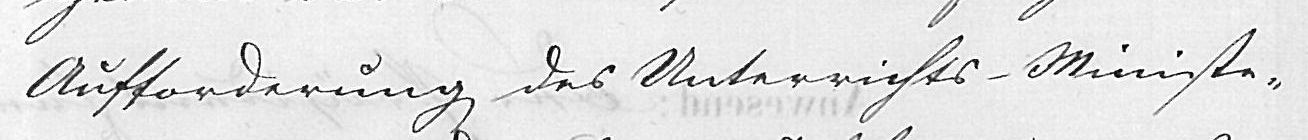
Aufforderung des Unterrichts-Ministe-
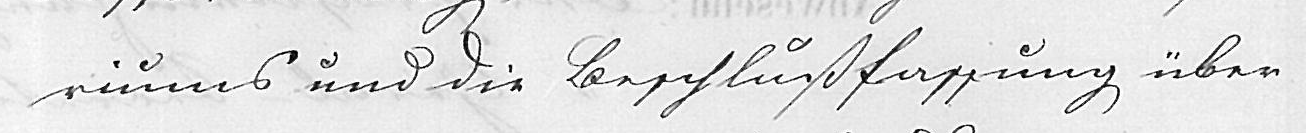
riums und die Beschlußfassung über
